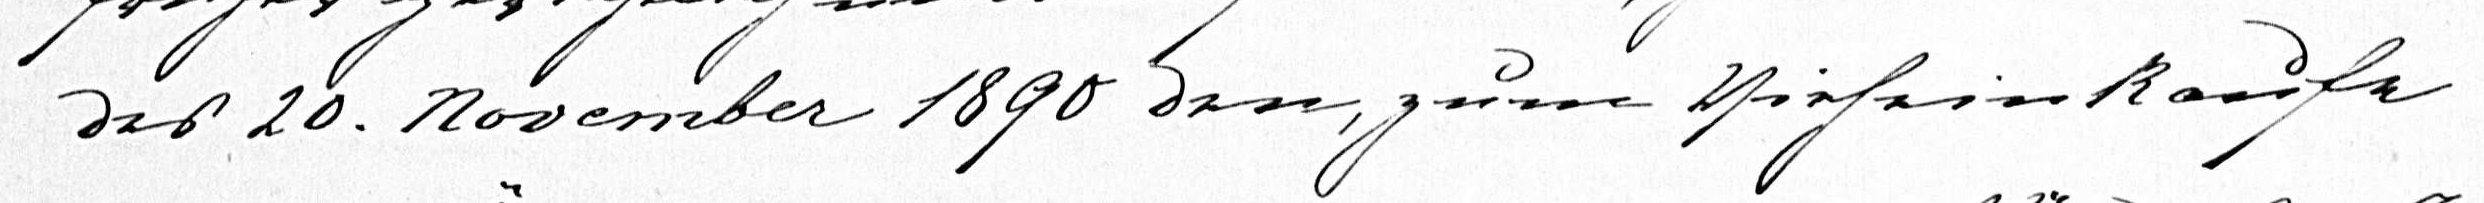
des 20. November 1890 den, zum Vieheinkaufe
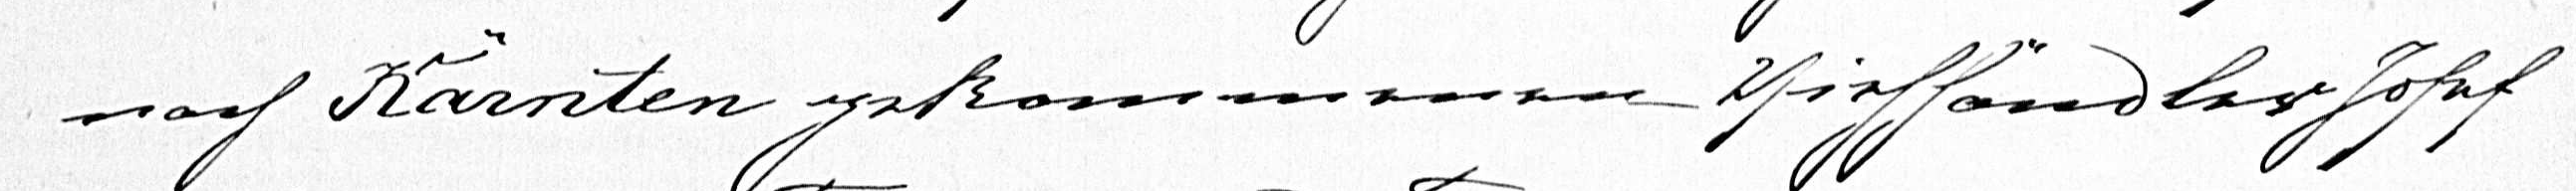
nach Kärnten gekommenen Viehhändler Josef
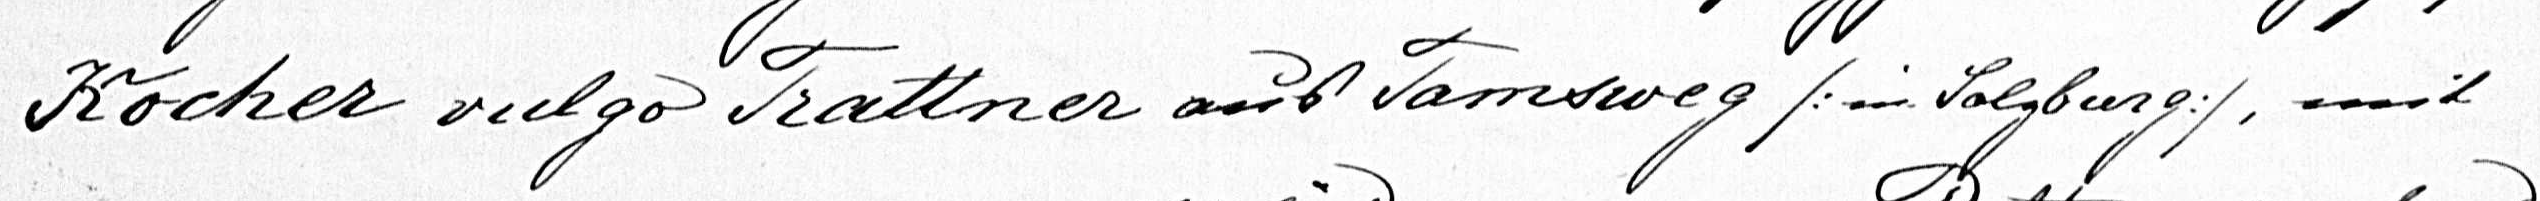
Kocher vulgo Trattner aus Tamsweg (in Salzburg), mit
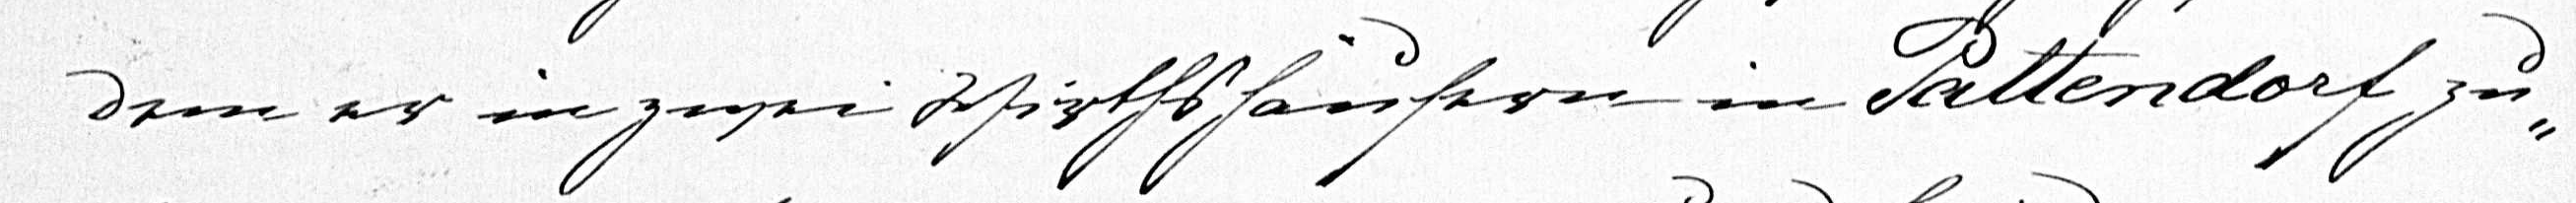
dem er in zwei Wirthshäusern in Pattendorf zu¬
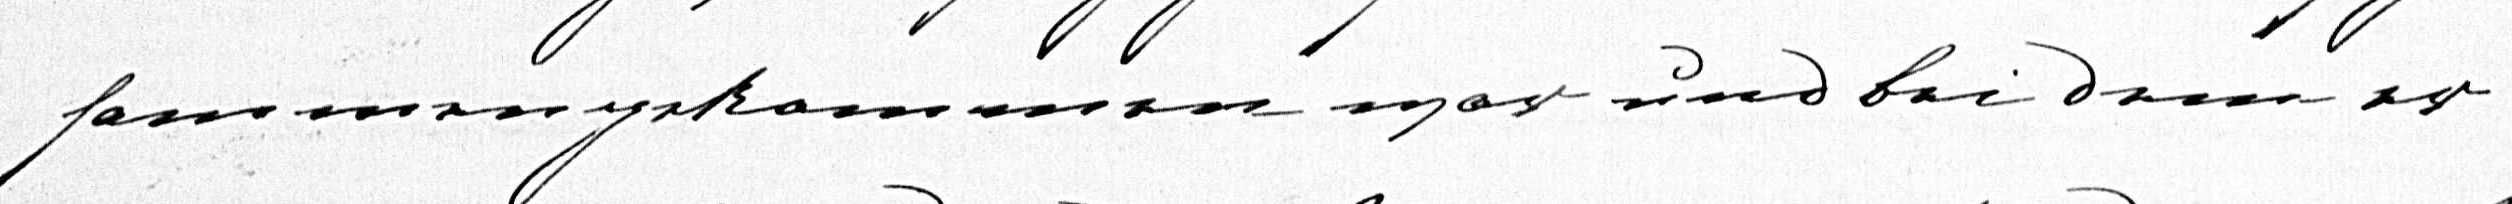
sammengekommen war und bei dem er
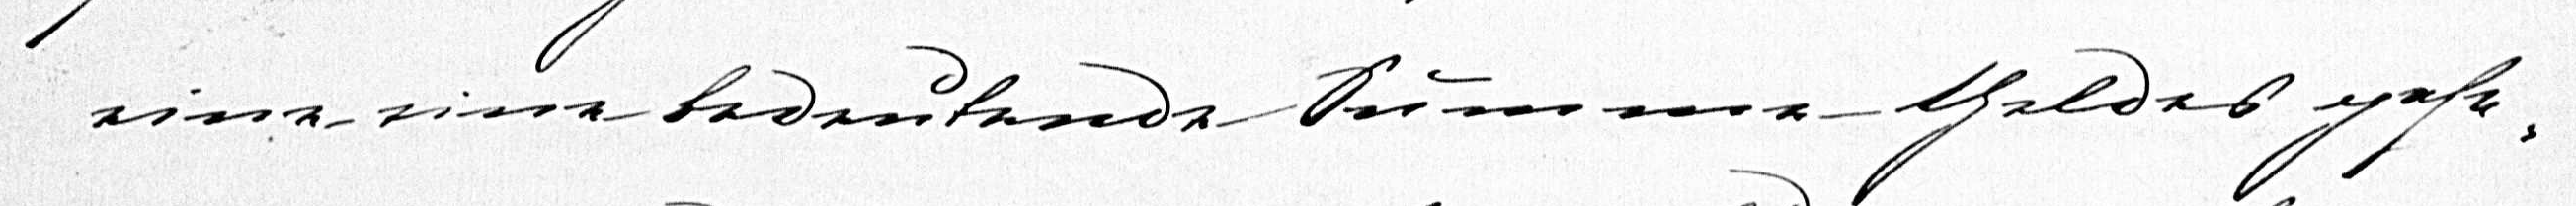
eine eine bedeutende Summe Geldes gese¬
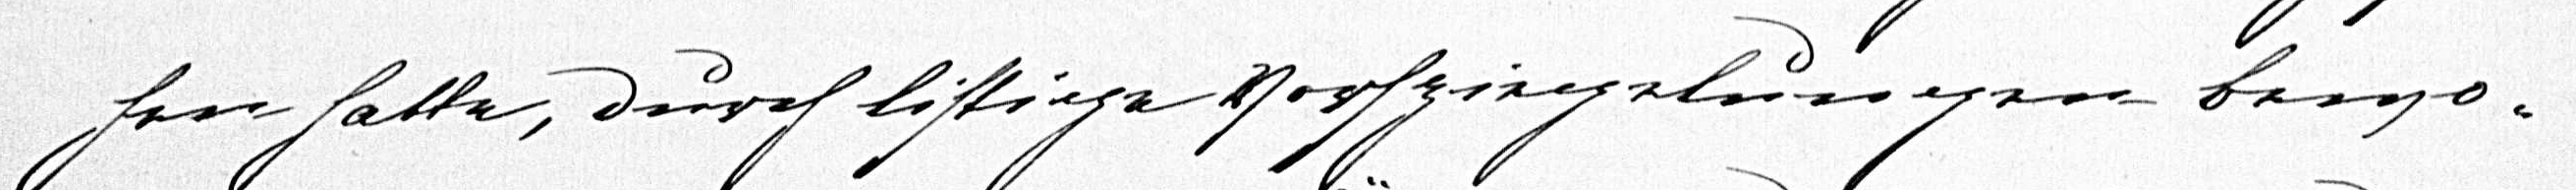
hen hatte, durch listige Vorspielungen bewo¬
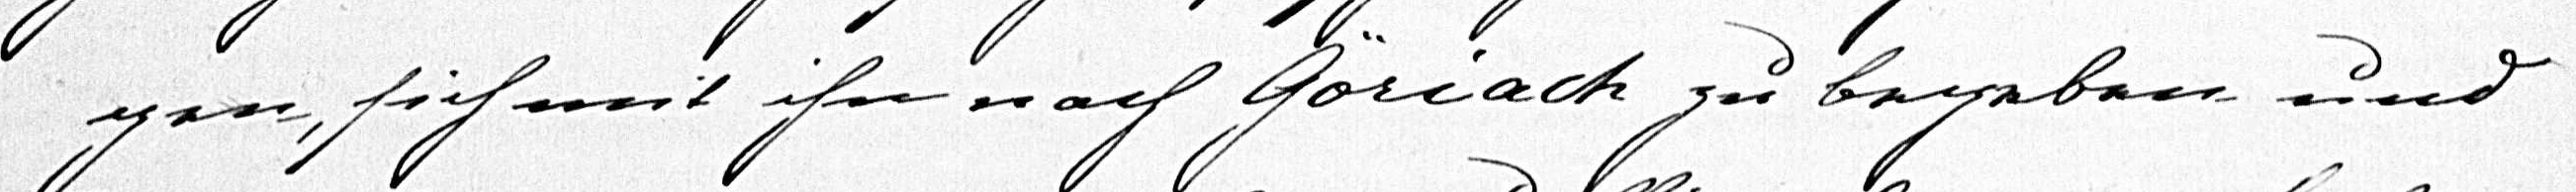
gen, sich mit ihn nach Göriach zu begeben und
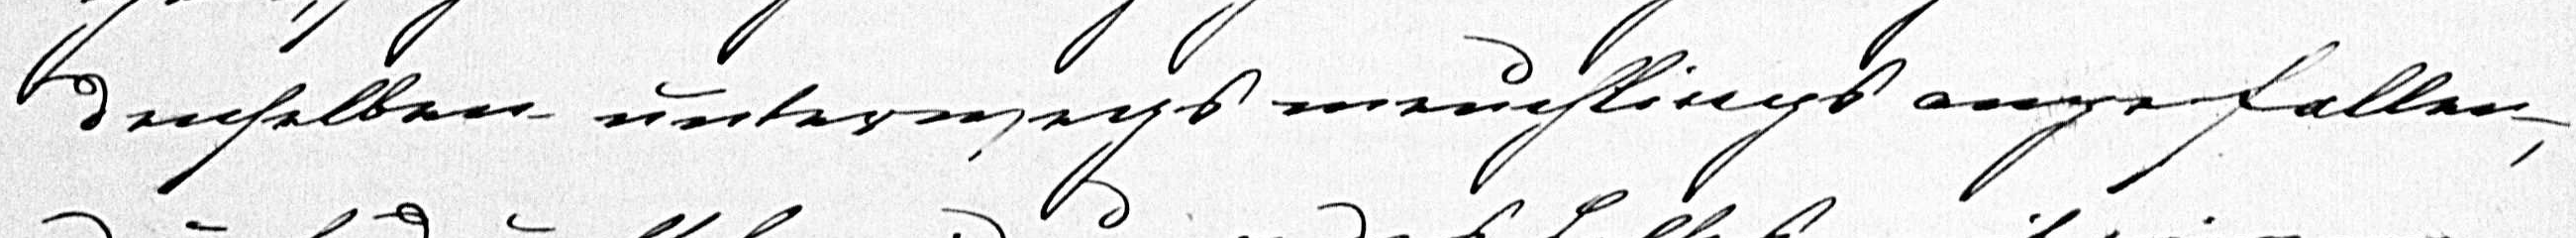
denselben unterwegs meuchlings angefallen,
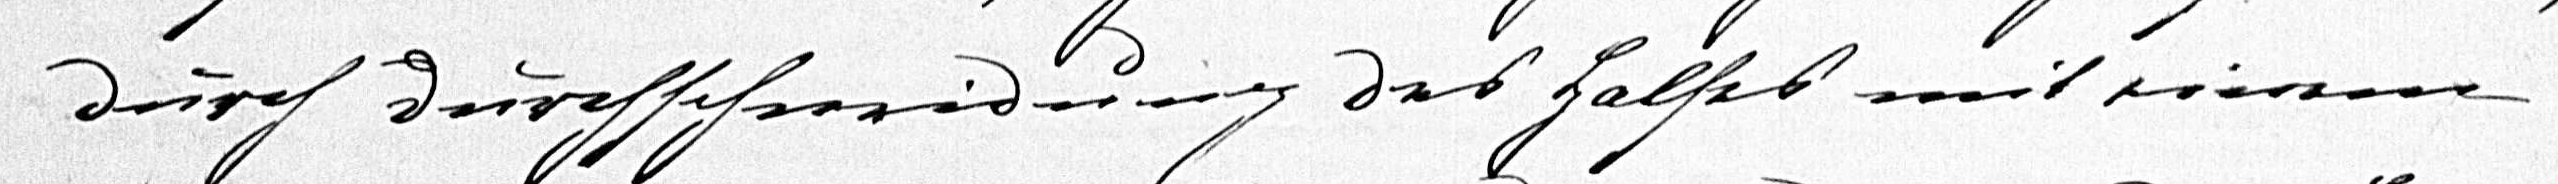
durch Durchschneidung des Halses mit einem
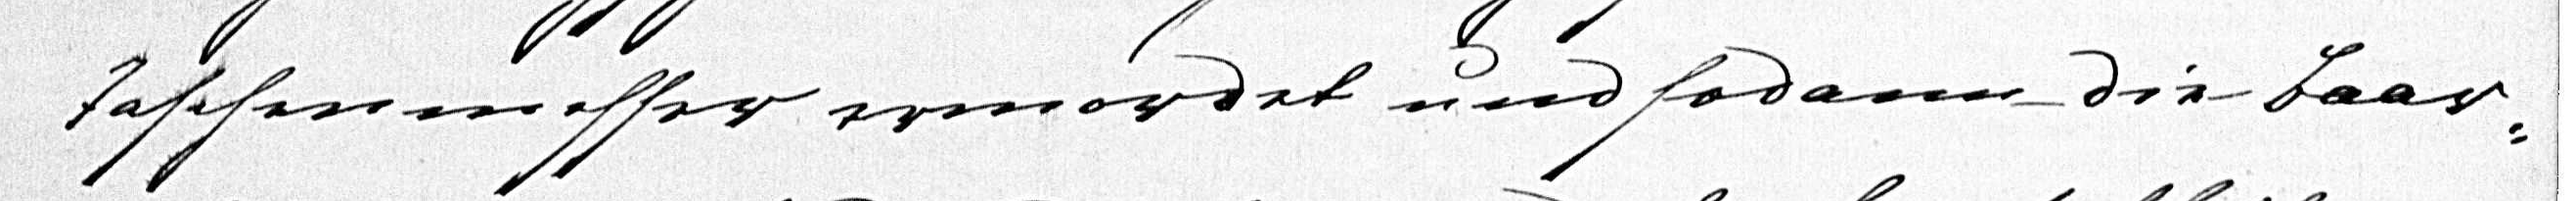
Taschenmesser ermordet und sodann die Baar¬
